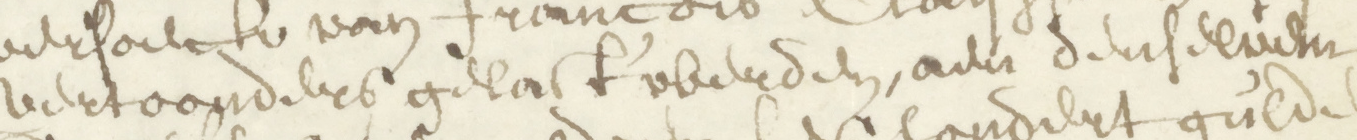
vertoonders gelast werden, aen denselven
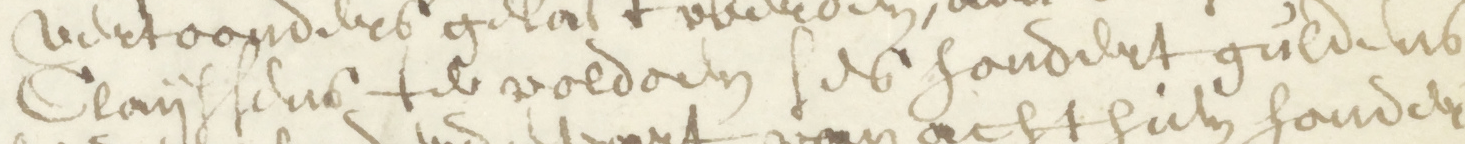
Claijssens te voldoen ses hondert guldens,
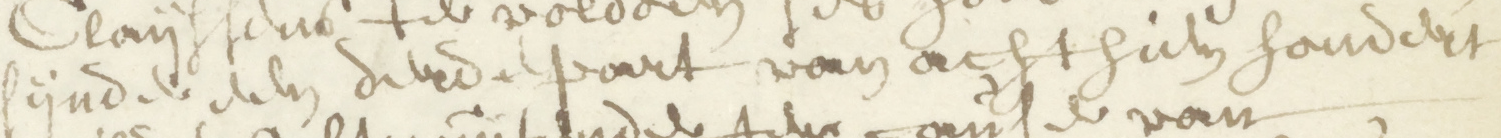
sijnde een derdepart van achthien hondert
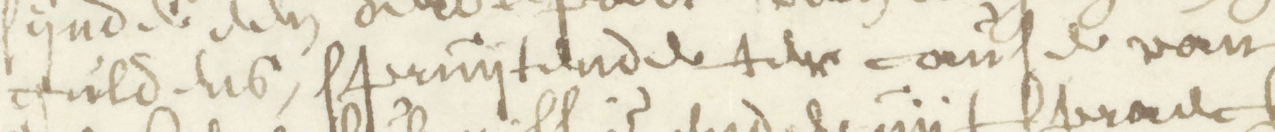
guldens, spuijtende ter cause van
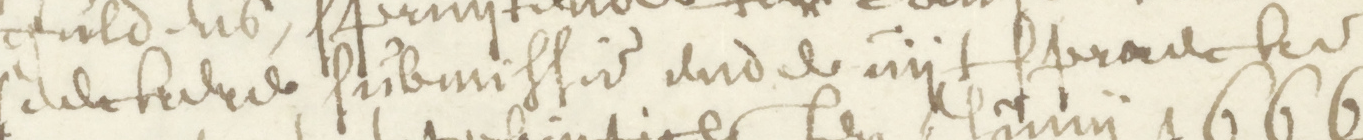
seeckere submissie ende uijtspraecke
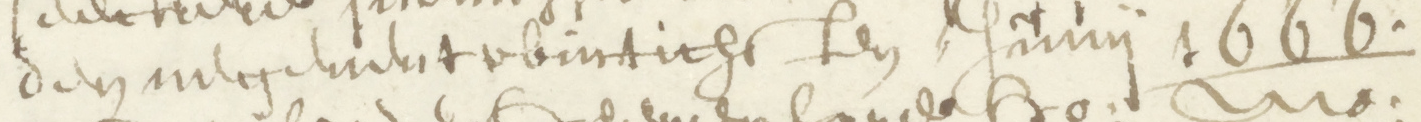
den negenentwintichsten Junij 1666.
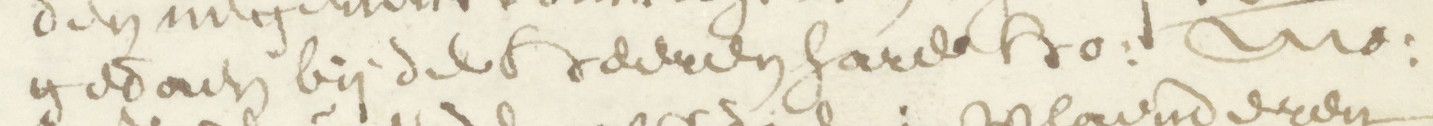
gedaen bij de Heeren hare Ho:Mo:
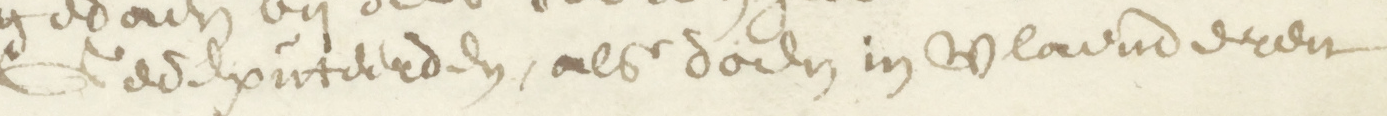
Gedeputeerden, als doen in Vlaenderen
